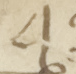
439
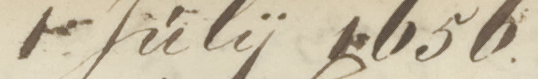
1e Julij 1656
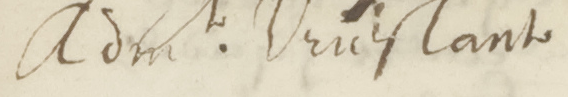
Admt. Vrieslant
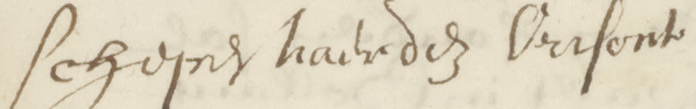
Schepen naer den Orisont
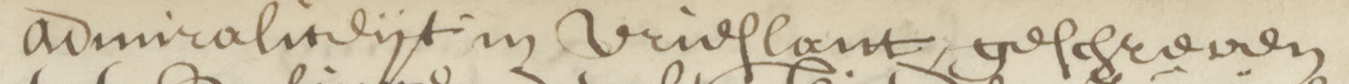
Admiraliteijt in Vrieslant, geschreven
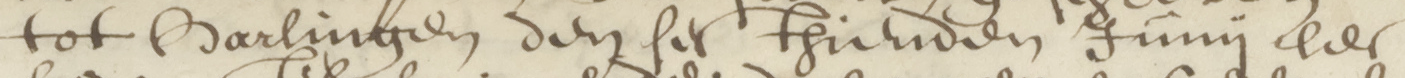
tot Harlingen den sesthienden Junij lest„
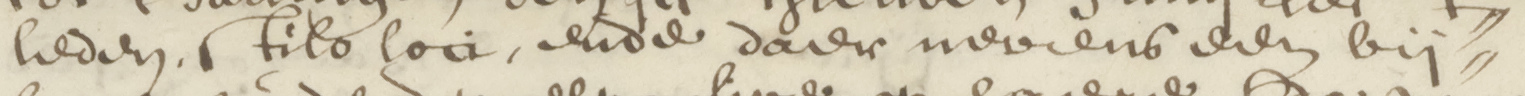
leden stilo loci, ende daer nevens een bij„
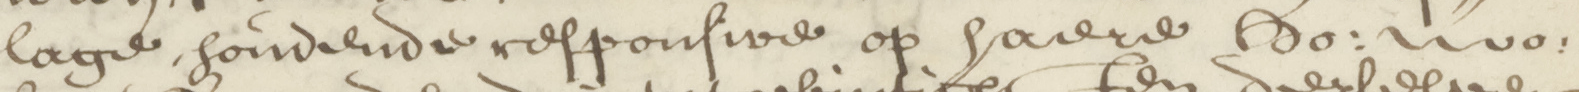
lage, houdende responsive op haere Ho:Mo:
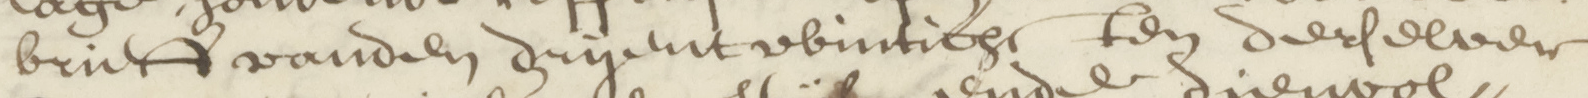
brieff vanden drijentwintichsten deselver
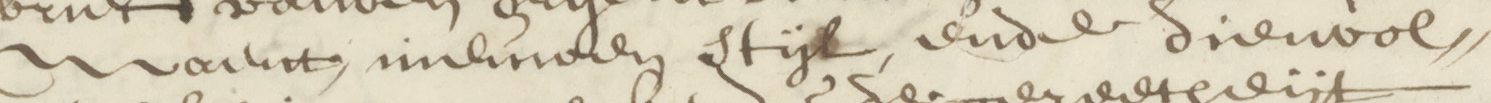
Maent, nieuwen stijl, ende dienvol„
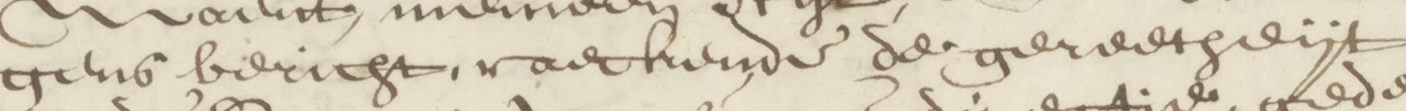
gens bericht, raeckende de gereetheijt
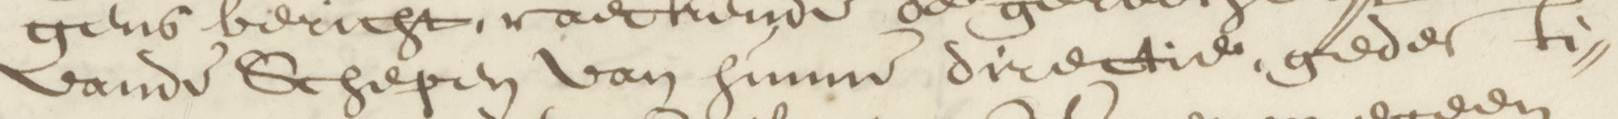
vanden Schepen van hunnen directie, gedesti„
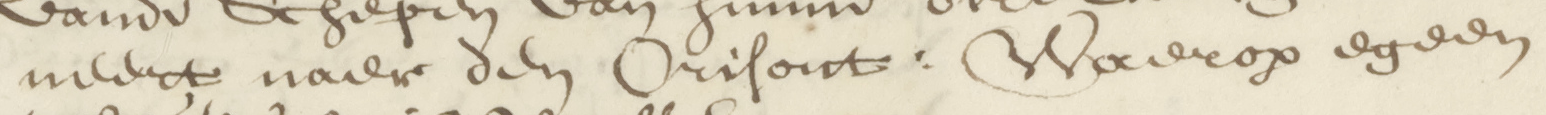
neert naer den Orisont: Waerop egeen
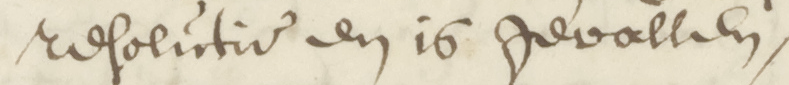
resolutie en is gevallen.
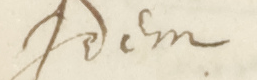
Idem
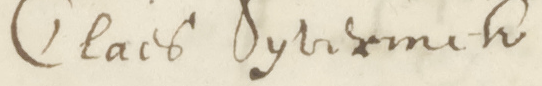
Claes Syverinck
